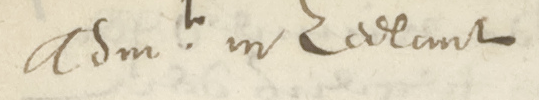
Admt. in Zeelant
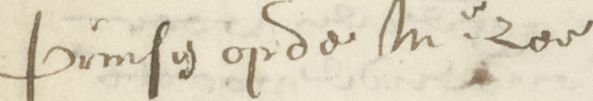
Prinsen op de Me. Zee
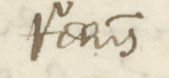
Rekn
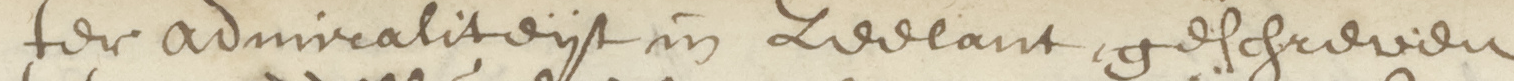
ter admiraliteijt in Zeelant, geschreven
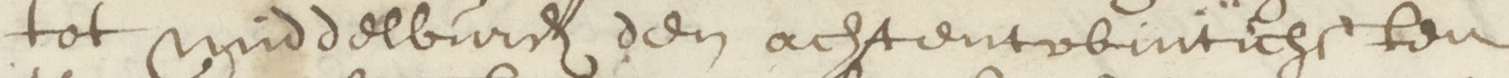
tot Middelburch den achtentwintichsten
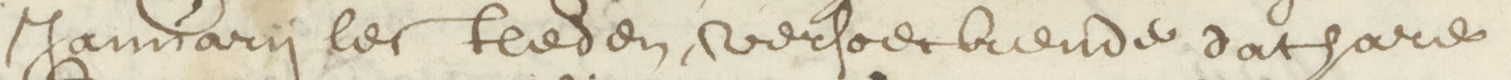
Januarij lestleden, versoeckende dat hare
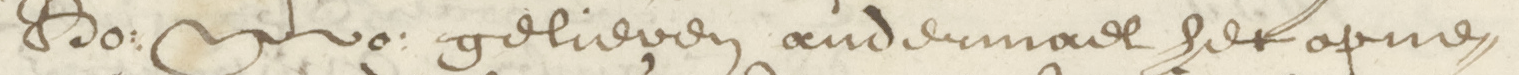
Ho:Mo: gelieven andermael het opne„
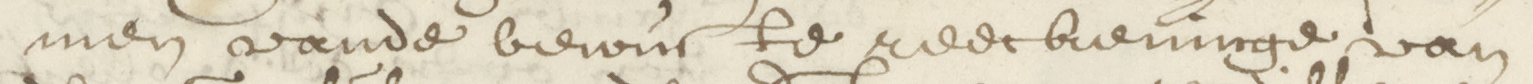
men vande bewuste reeckeninge van
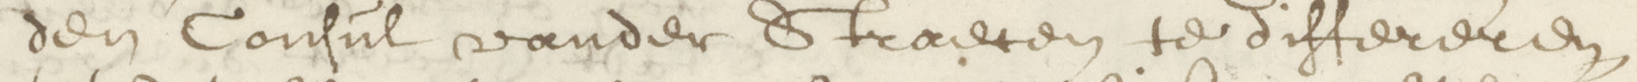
den Consul vander Straeten te differeren,
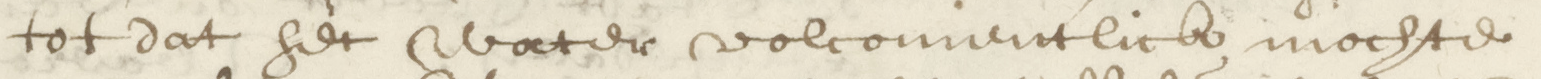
tot dat het Water volcomentlick mochte
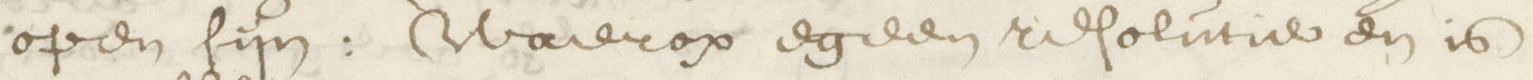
open sijn: Waerop egeen resolutie en is
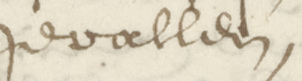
gevallen.
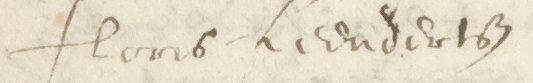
Floris Leendertsz
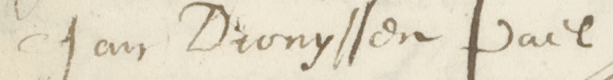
Jan Dionyssen Pael
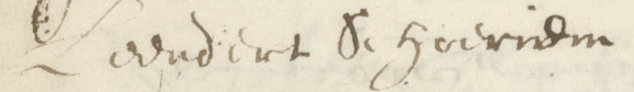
Leendert Schoeriem
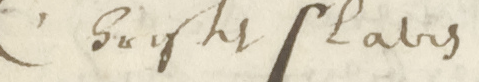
Christen Slaven
